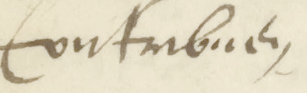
Contribue
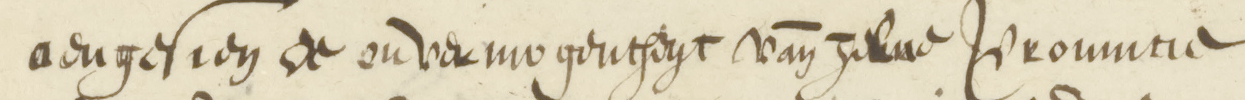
aengesien de onvermogentheyt van zelve prouincie
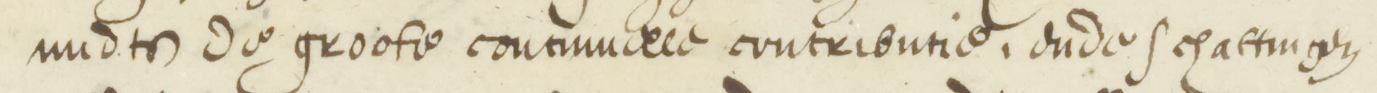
midts de groote continuele contributie, ende schattingen
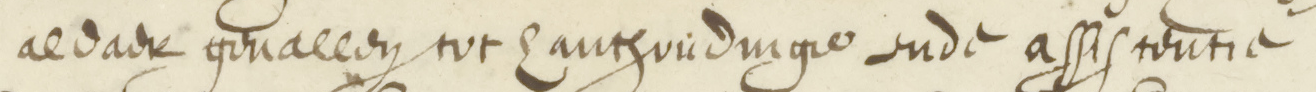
aldaer geuallen tot hanthoudinge ende assistentie
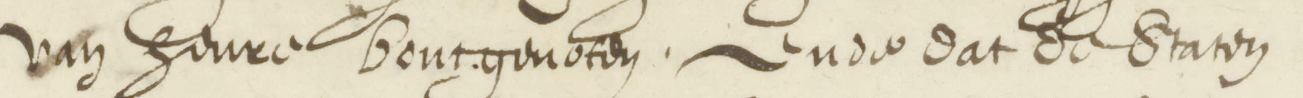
van heure bontgenoten, ende dat de Staten
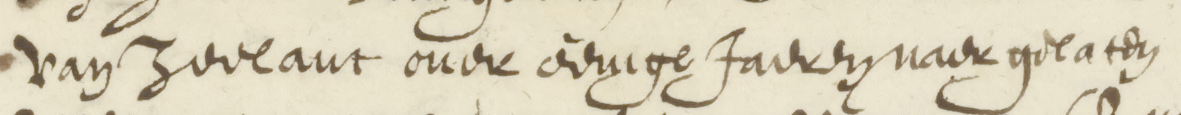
van Zeelant ouer eenige Jaeren naer gelaten
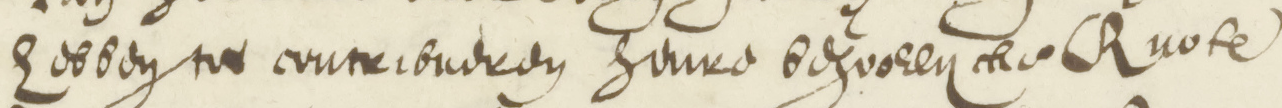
hebben te contribueren heure behoorlycke Quote
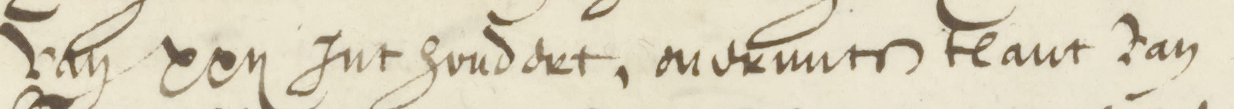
van xxij Int hondert, ouermits tlant van
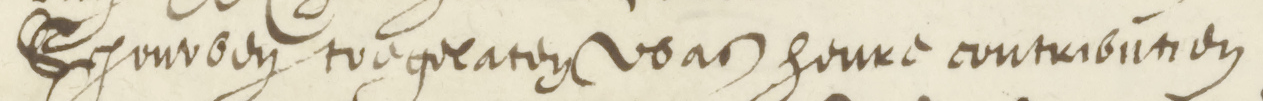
Schouwen toe gelaten was heure contributien
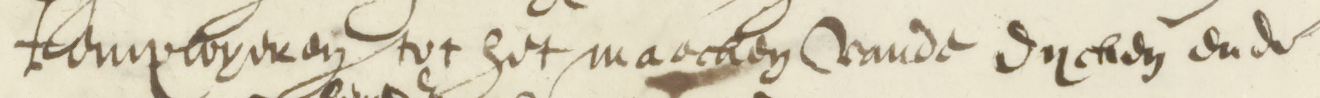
temployeren tot het maecken vande dycken ende
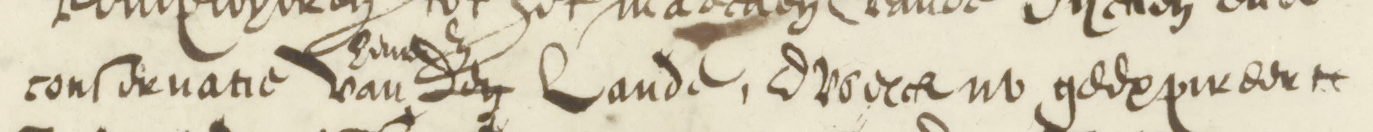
conseruatie van heure den lande, dwelck nu geexpireert
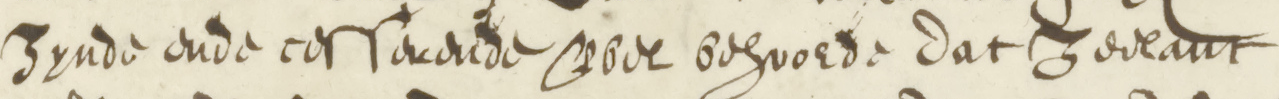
zynde ende cesserende wel behoorde dat Zeelant
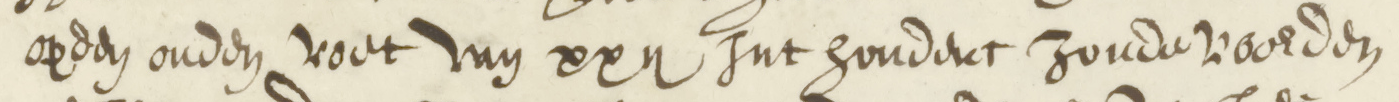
opden ouden voet van xxij int hondert zoude worden
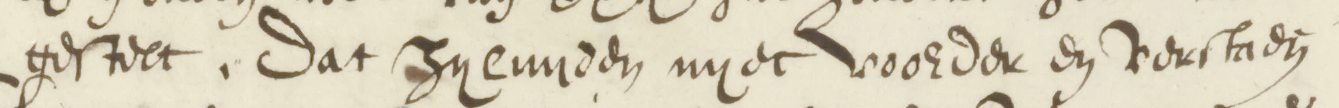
gestelt, dat zijluijden nyet voorder en verstaen
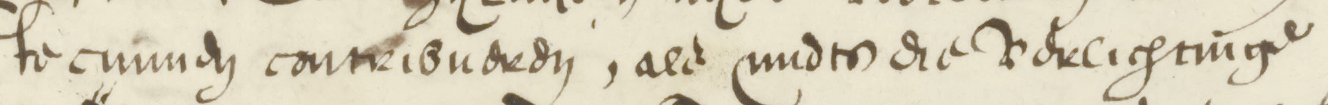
te cunnen contribueren, als midts die verlichtinge
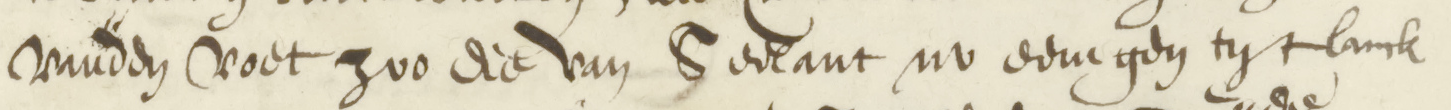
vanden voet zoo die van Seelant nu eenigen tyt lanck
